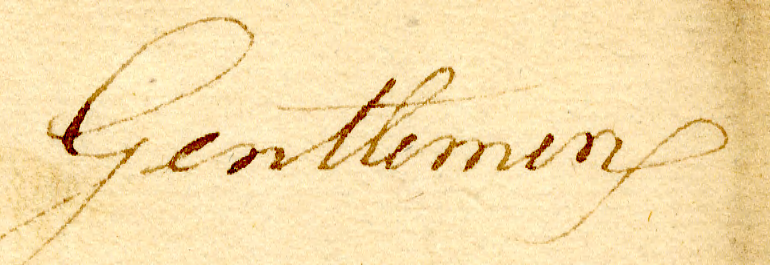Gentlemen
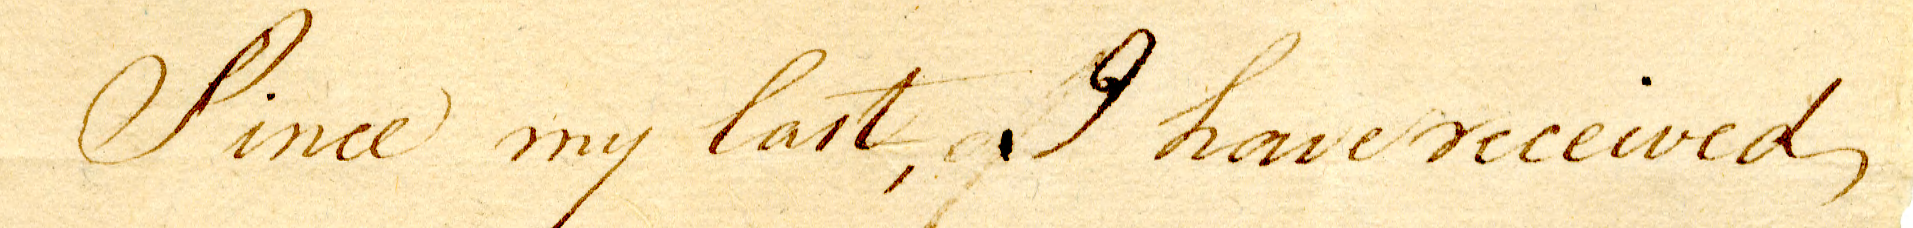Since my last, I have received
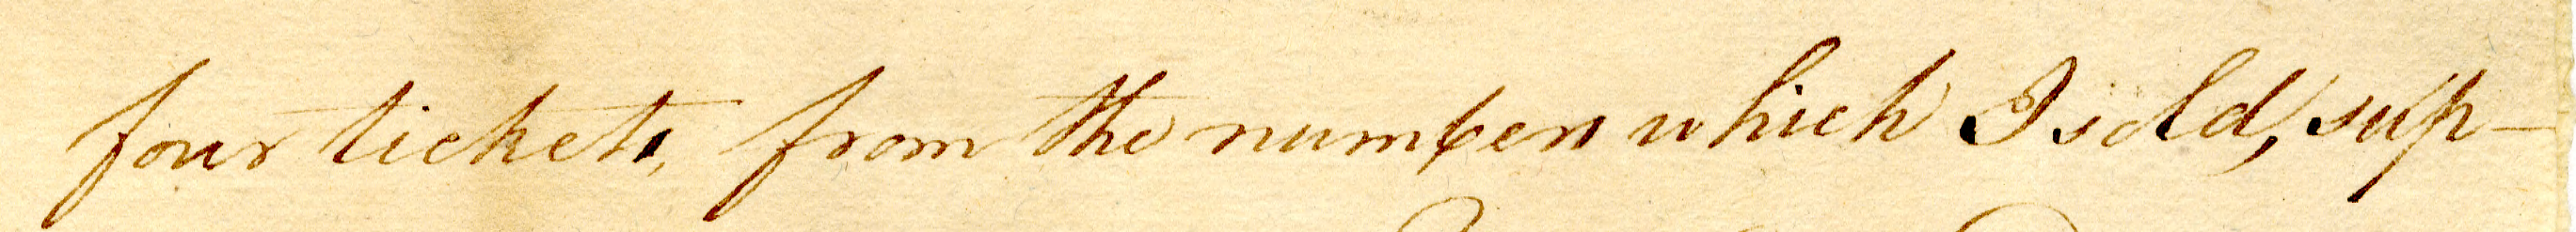four tickets from the numbers which I sold, sup-
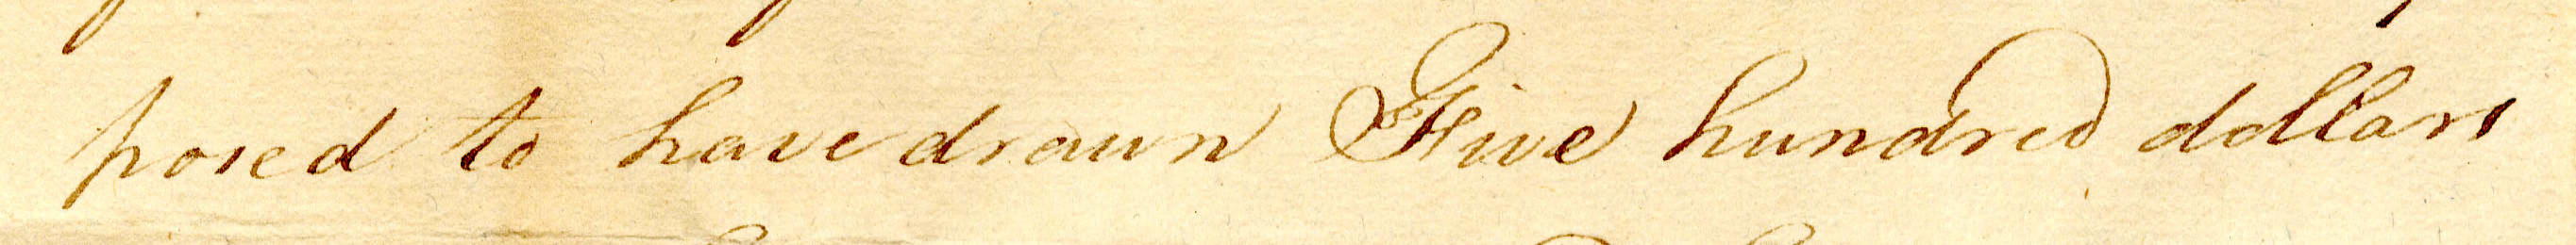posed to have drawn Five hundred dollars
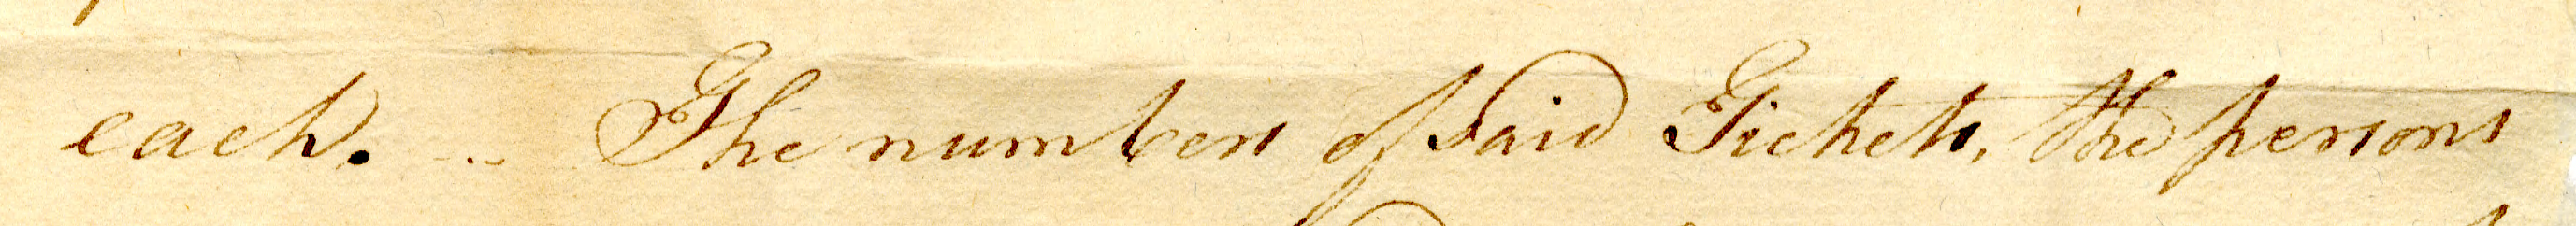each. The number of said Tickets, the persons
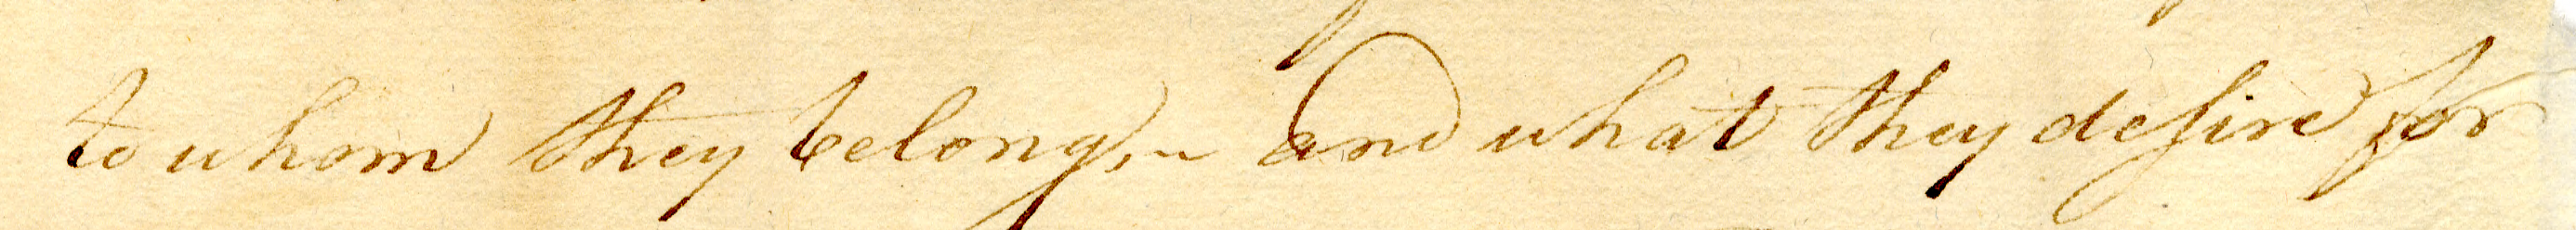to whom they belong,- and what they desire for
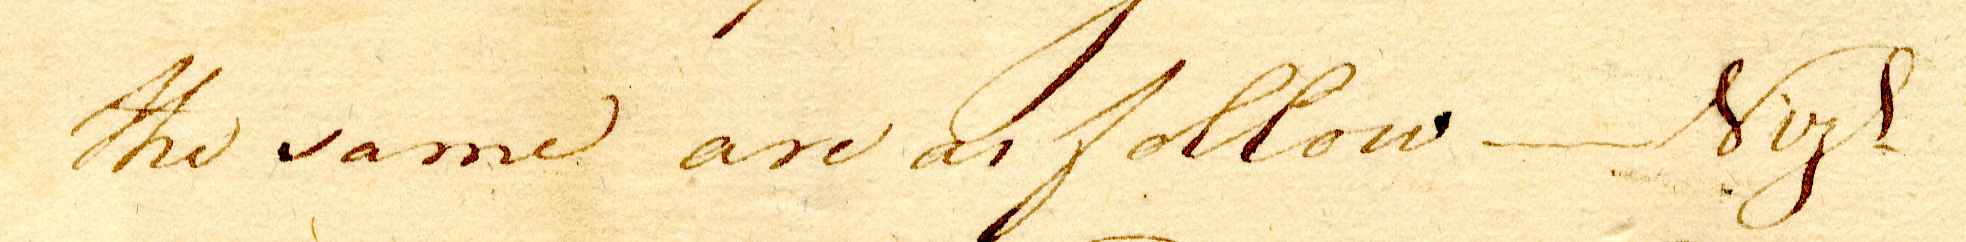the same are as follow-Viz^t
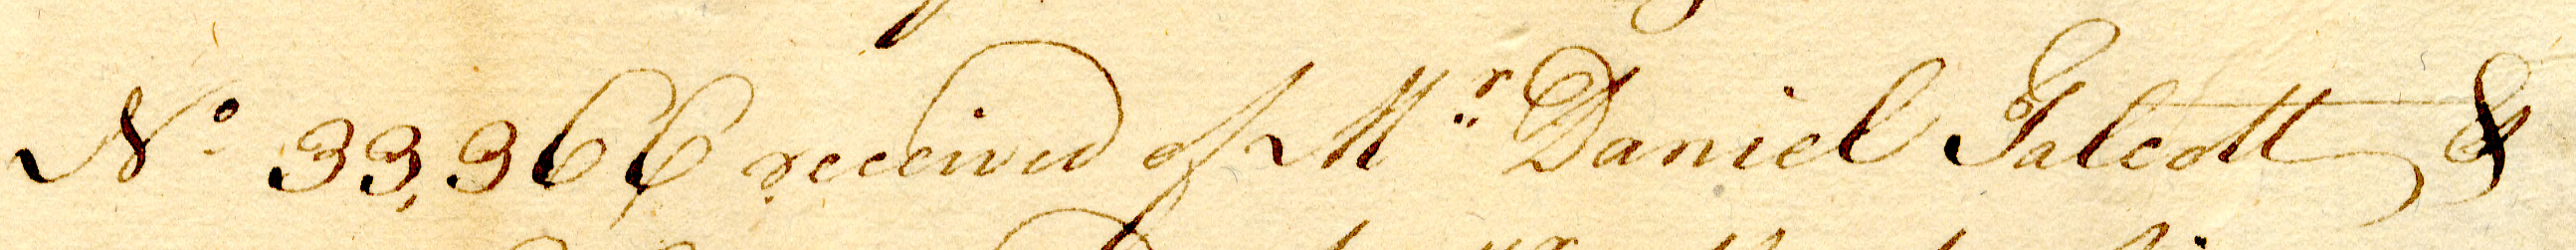N^o. 33,366 received of M^r. Daniel Talcott &
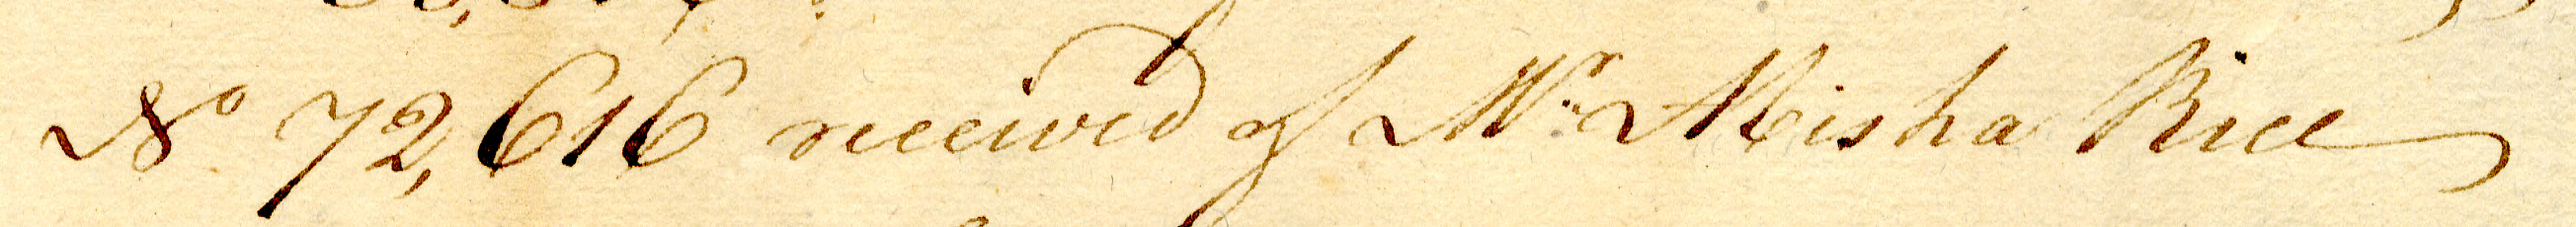N^o 72, 616 received of M^r. Alisha Rice
